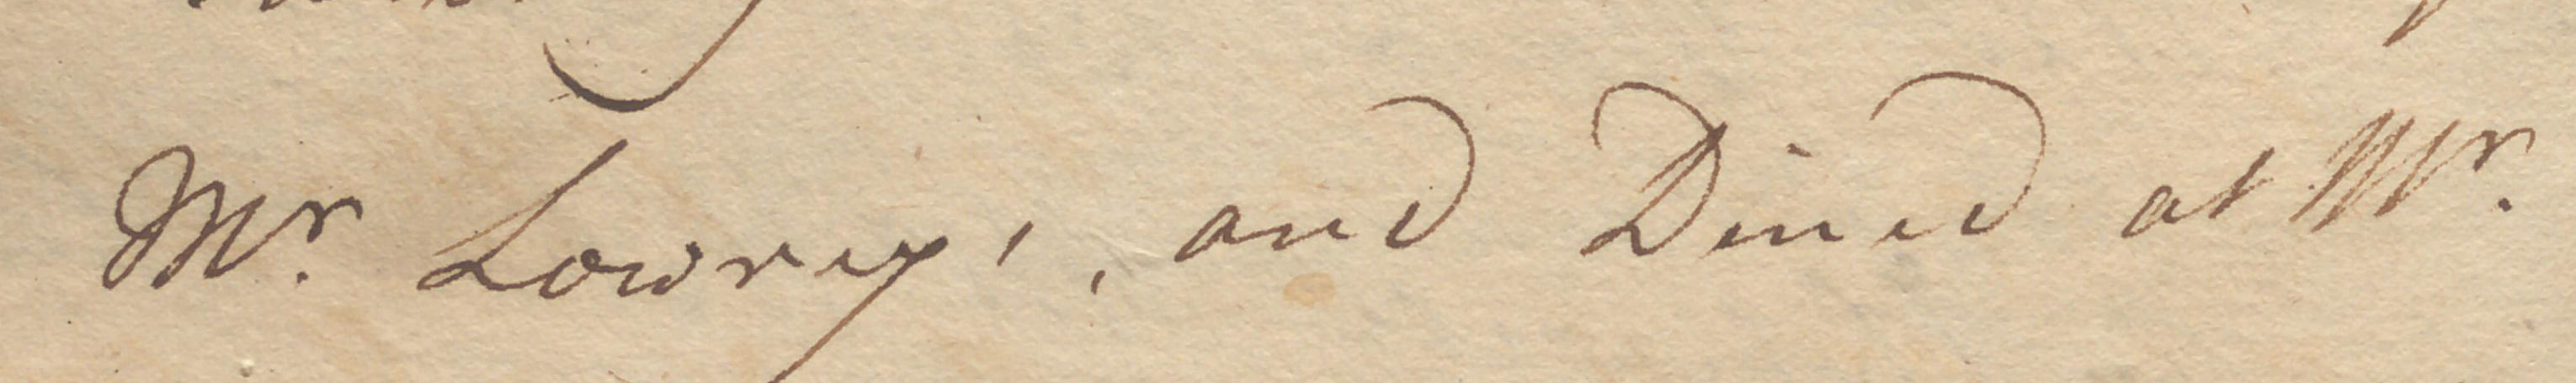M^r. Lowreys and Dined at M^r.
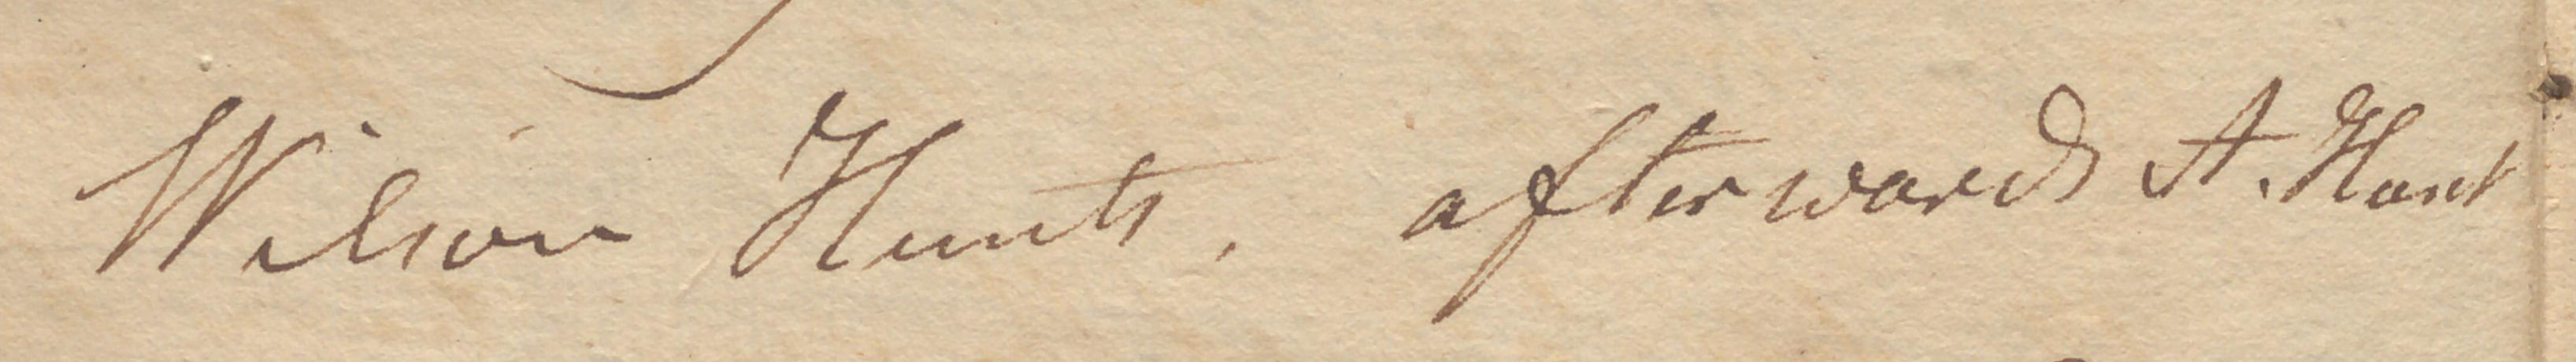Wilson Hunts, afterwards A. Hunt
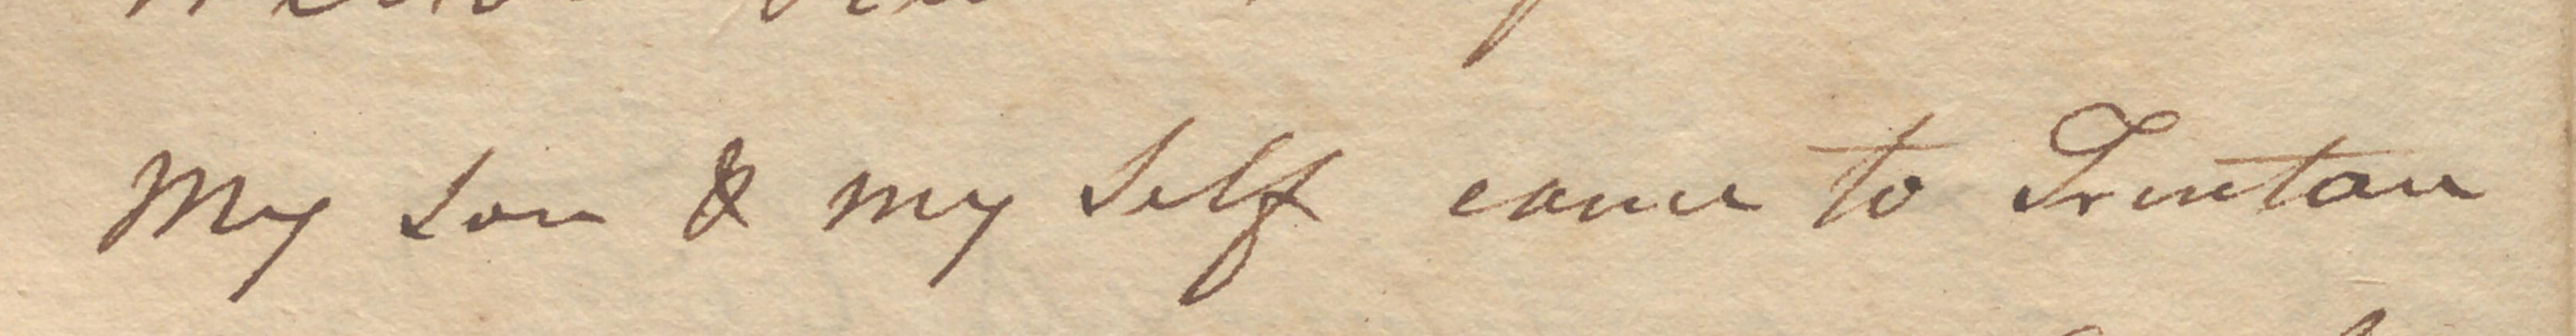My son & my self came to Trenton
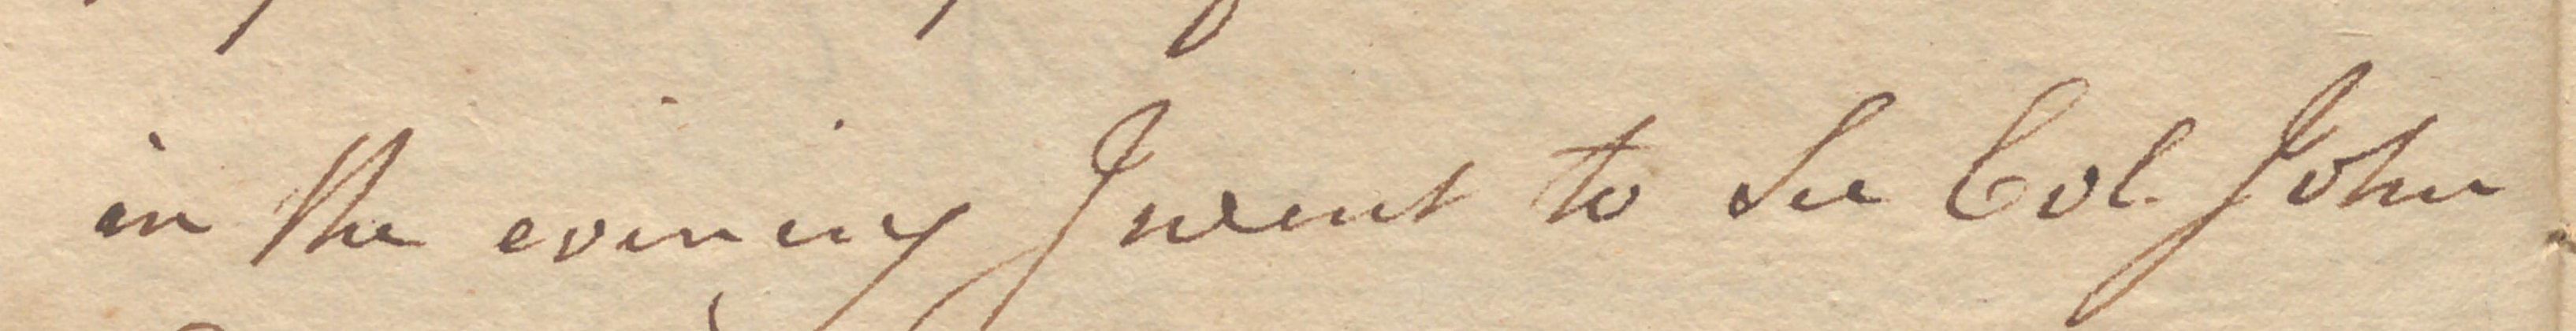in the evening I went to see Col. John
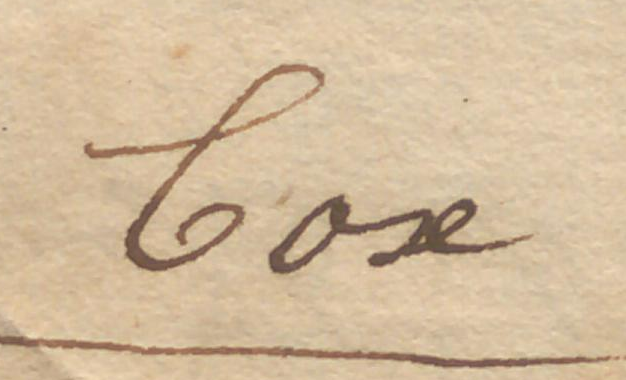Cox
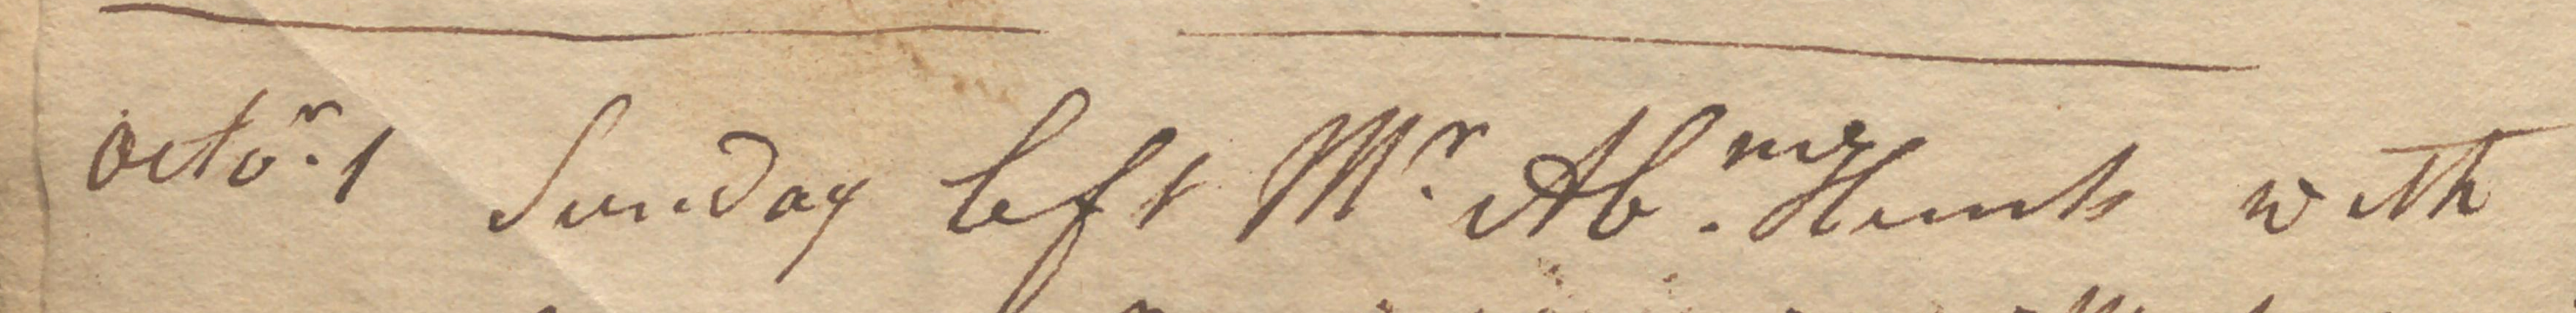Octo^r. 1 Sunday left M^r. Ab^m. Hunts with
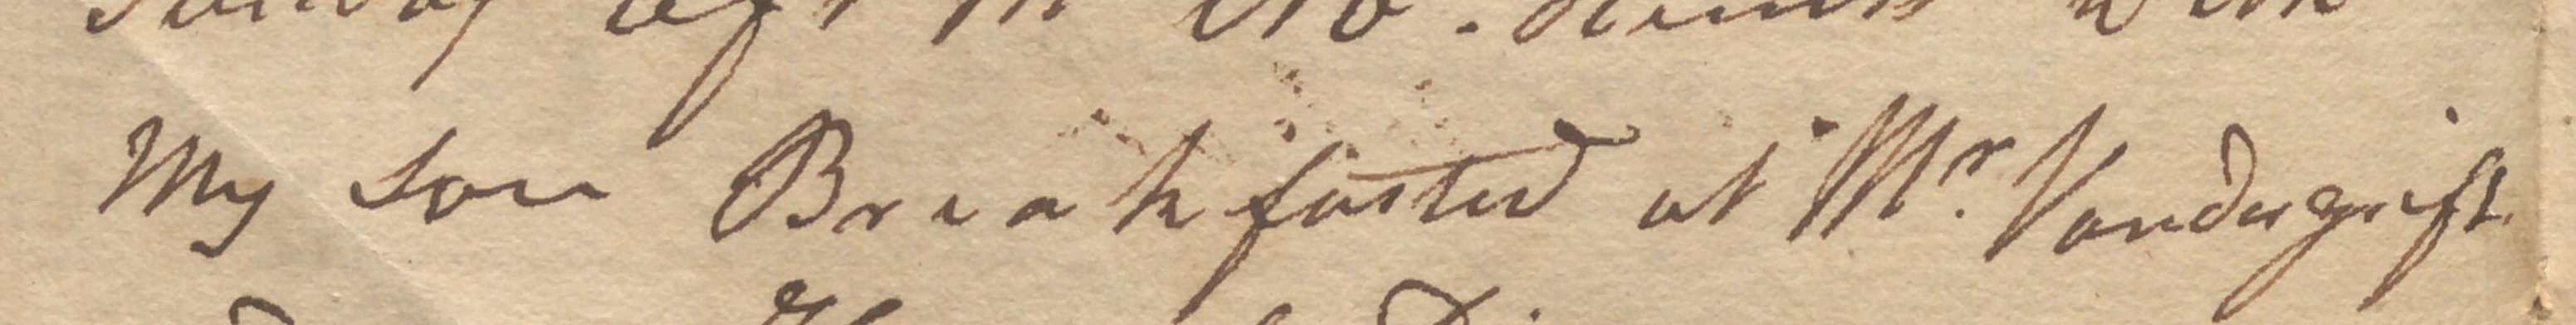My son Breakfasted at M^r. Vandergrift
